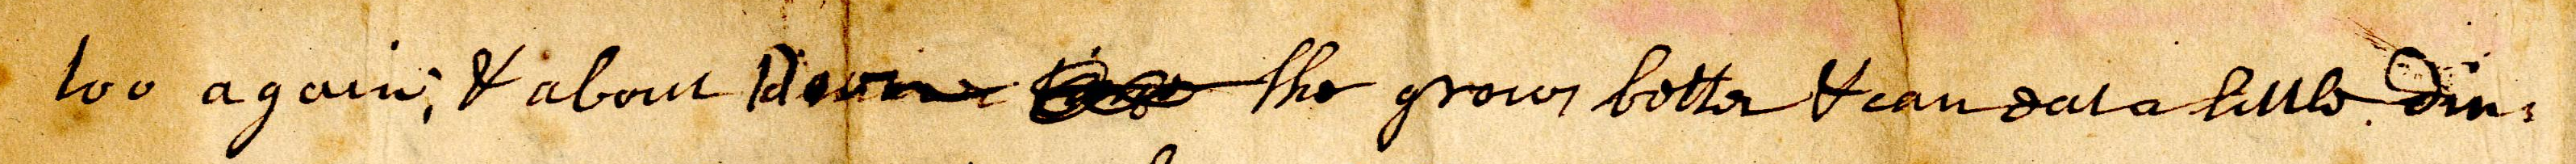too again; & about [____] [___] she grows better & can eat a little din:
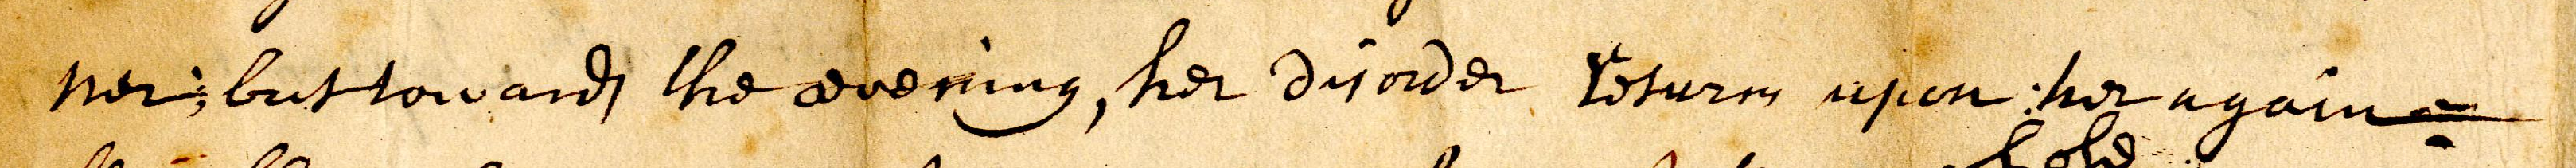ner; but towards the evening, her disorder returns upon her again
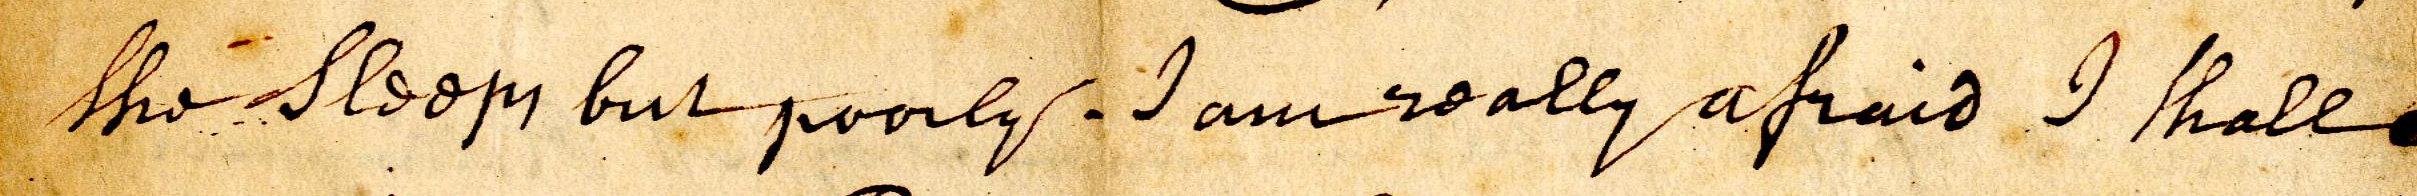she sleeps but poorly. I am really afraid I shall
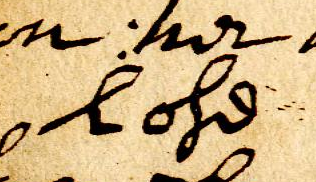lose
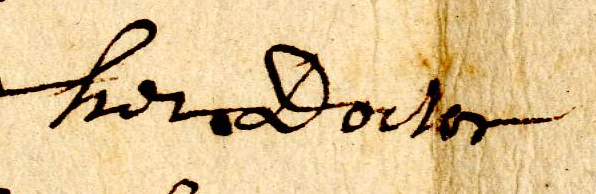her Doctor
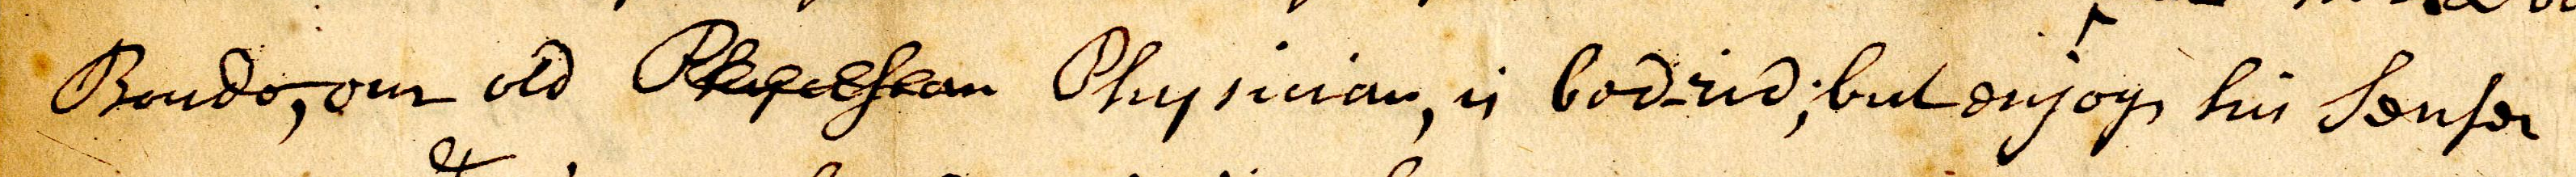Boudo, our old [________] Physician is bedrid; but enjoys his senses
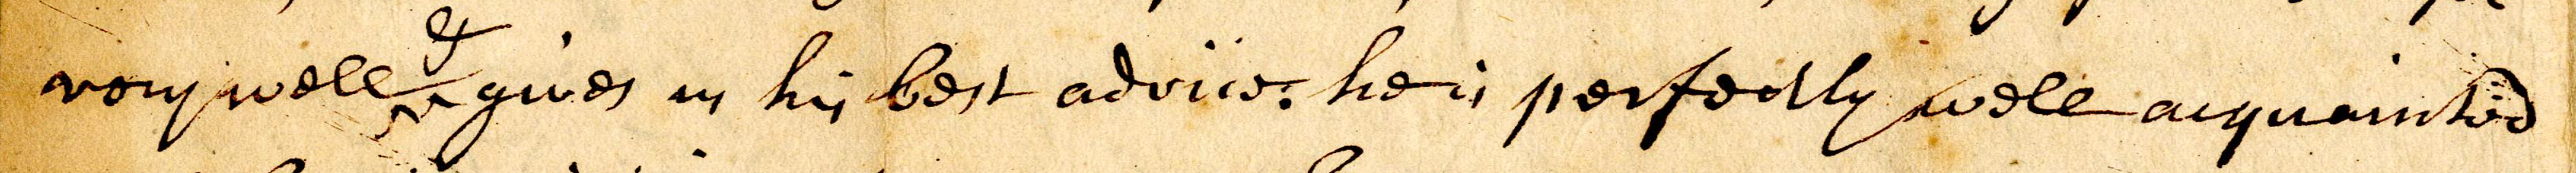very well ^^& gives his best advice. he is perfectly well acquainted
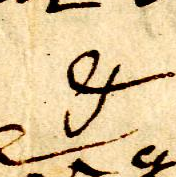&
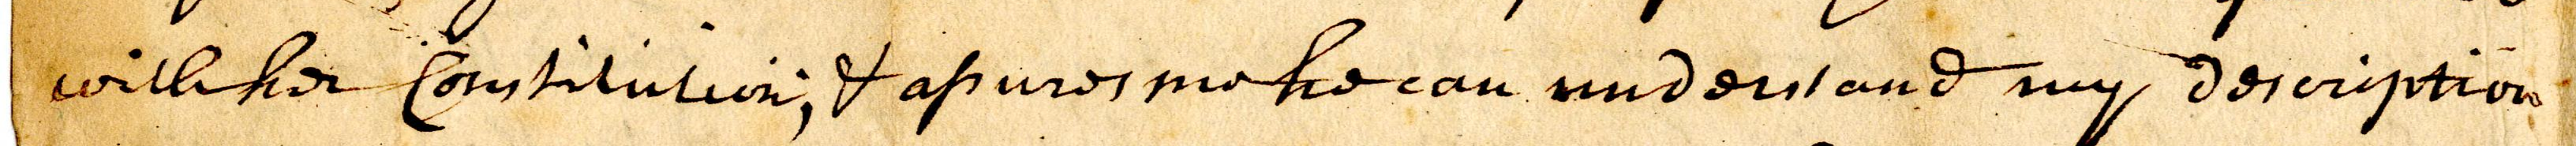with her Constitution, & assures me he can understand my description
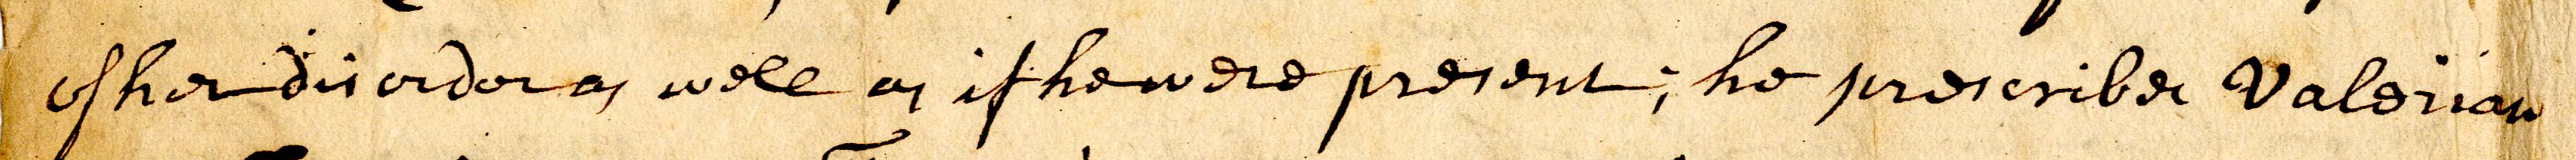of her disorder as well as if he were present; he prescribes Valerian
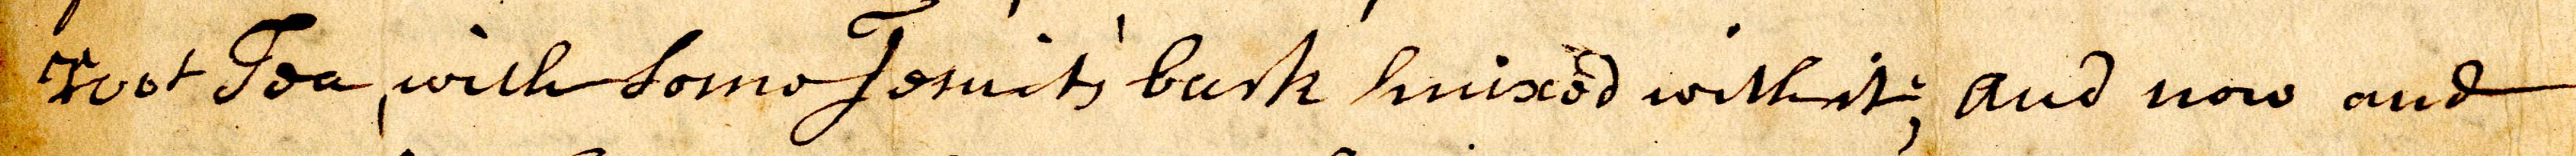root Tea, with some Jesuits' bark mixed with it; and now and
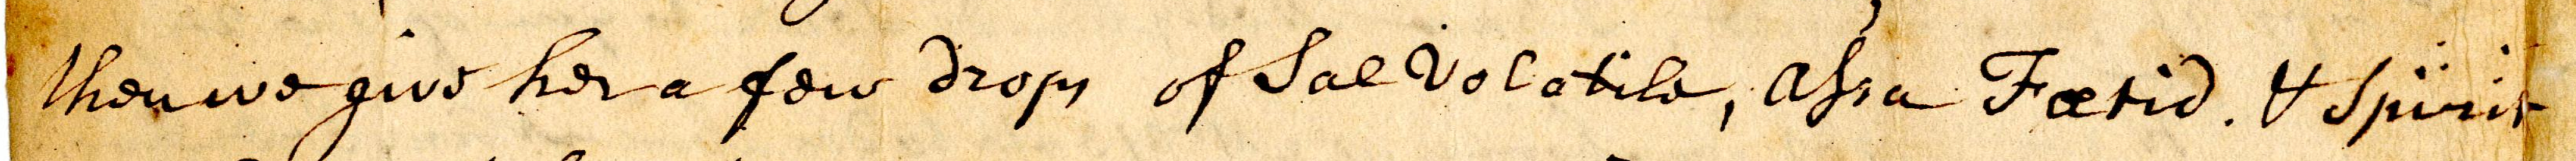then we give her a few drops of Sal Volatile, as a Foetid & Spirit
